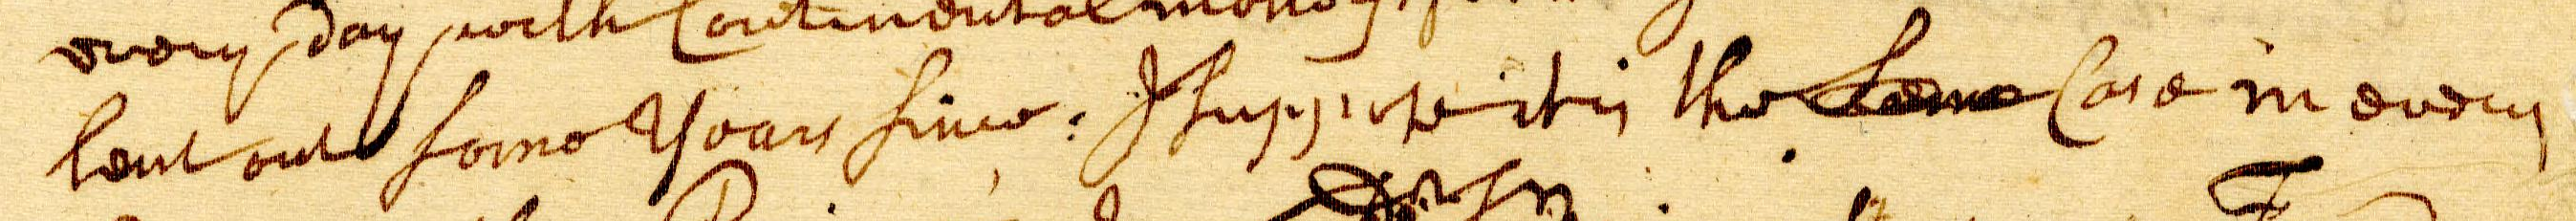lent out some Years since: I suppose it is the [Same] Case in every
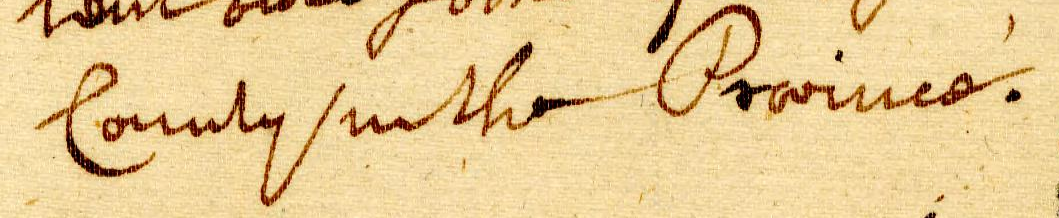County in the Provinces.
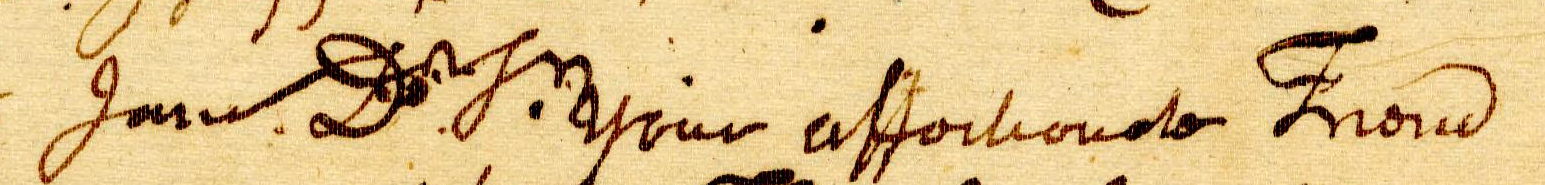I am D^r. J^r. Your affectionate Friend
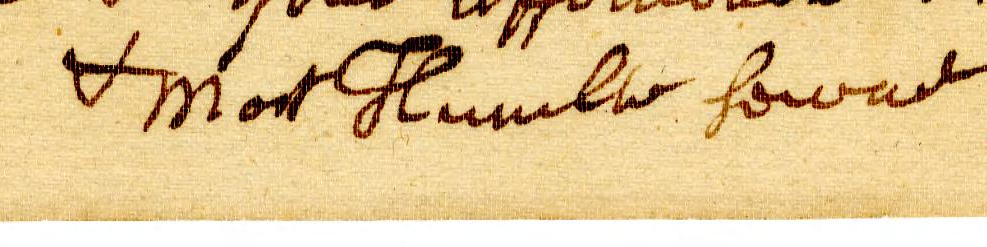& Most Humble Servant
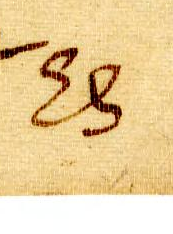ES
